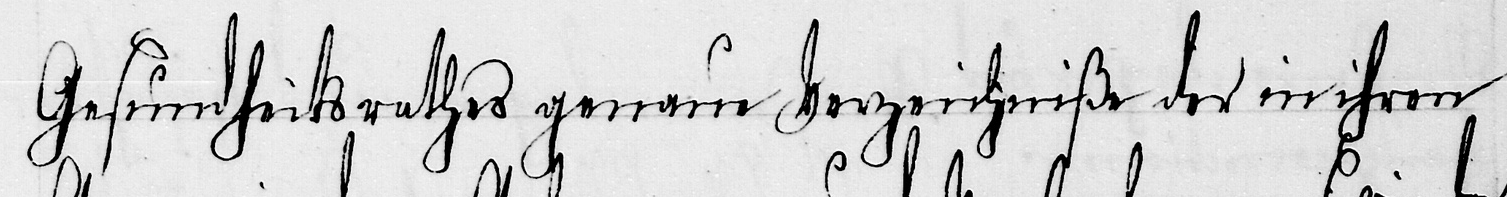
Gesundheitsrathes genaue Verzeichniße der in ihren
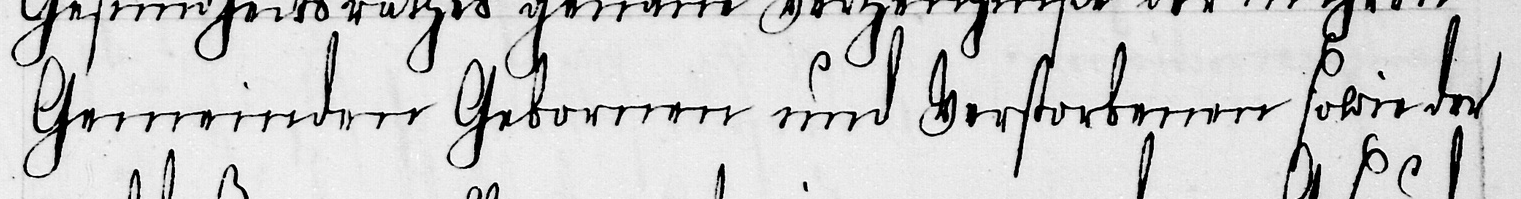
Gemeinden Gebornen und Verstorbenen sowie der
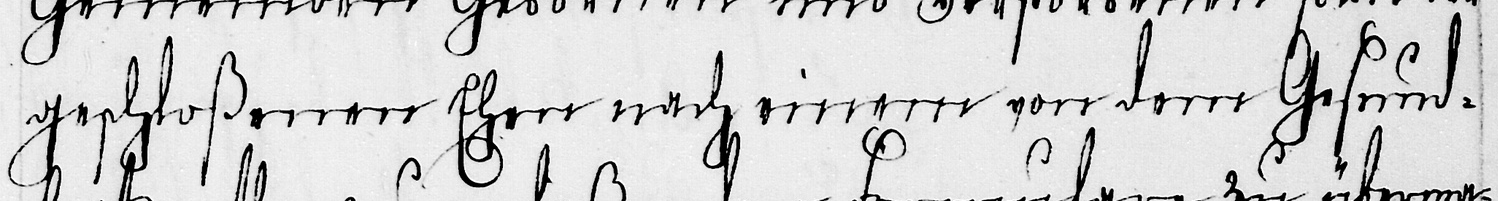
geschloßenen Ehen nach einem von dem Gesund¬
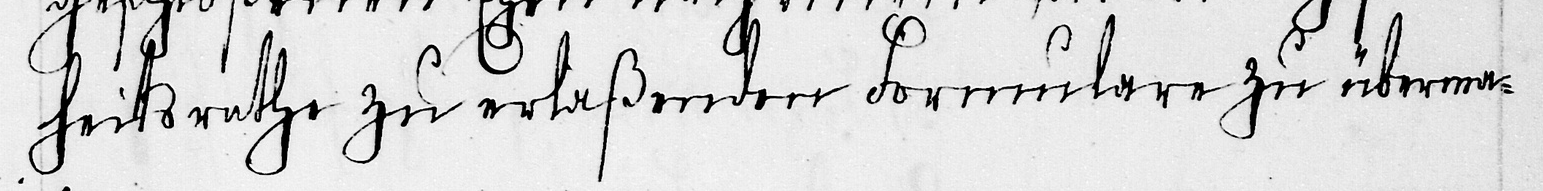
heitsrathe zu erlaßenden Formulare zu überma¬
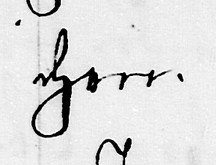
chen.
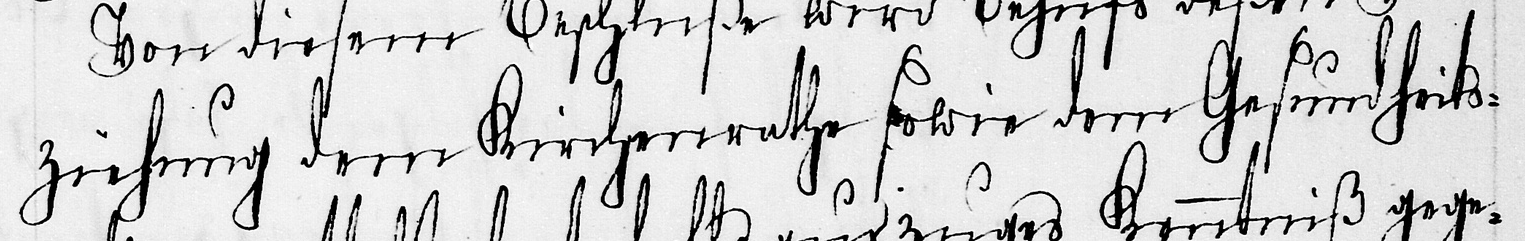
ziehung dem Kirchenrathe sowie dem Gesundheits¬
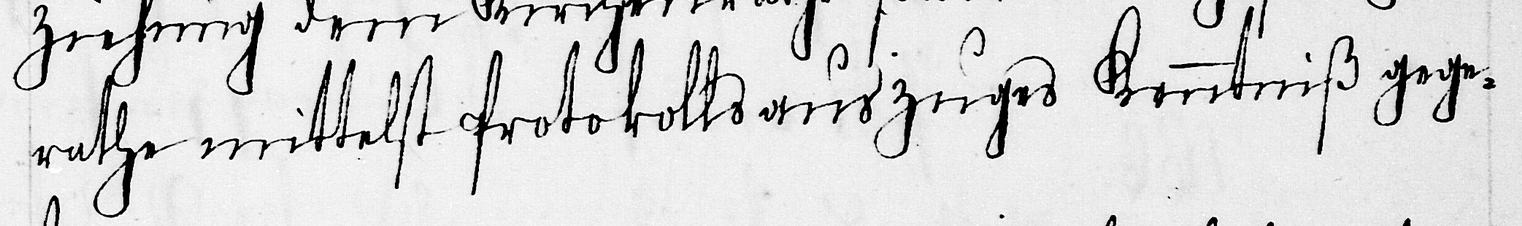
rathe mittelst Protokollsauszuges Kenntniß gege¬
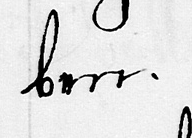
ben.
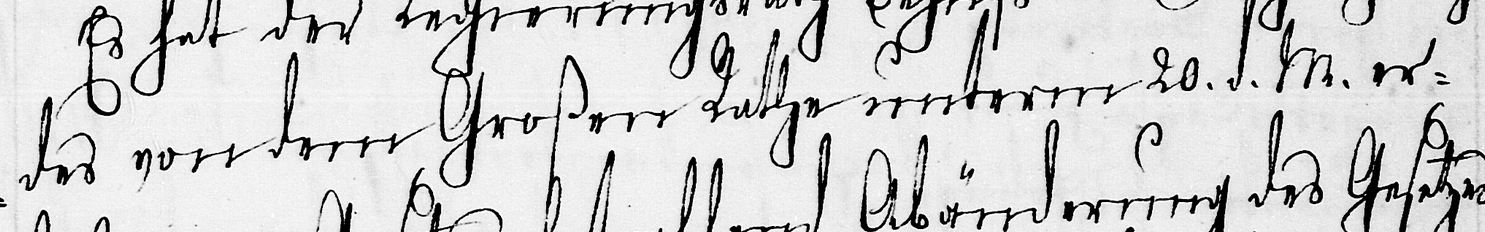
des von dem Großen Rathe unterm 20. d. M. er¬
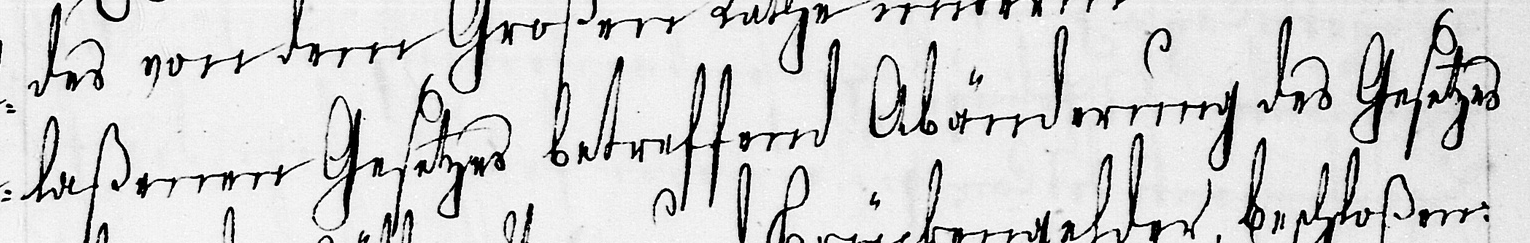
laßenen Gesetzes betreffend Abänderung des Gesetz¬
